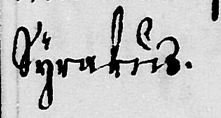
Syrakus.
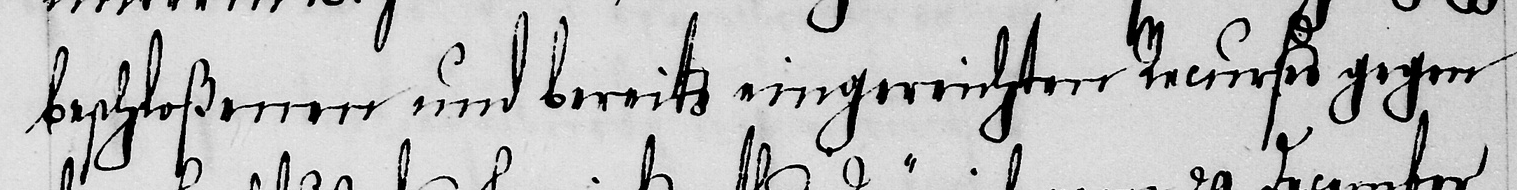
beschloßenen und bereits eingereichten Recurses gegen
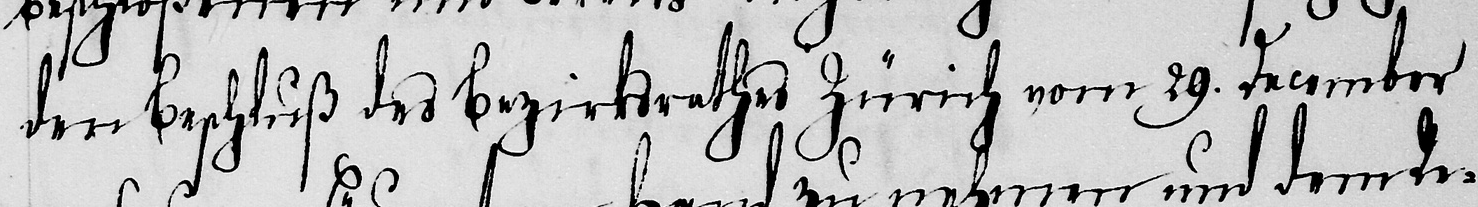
den Beschluß des Bezirksrathes Zürich vom 29. December
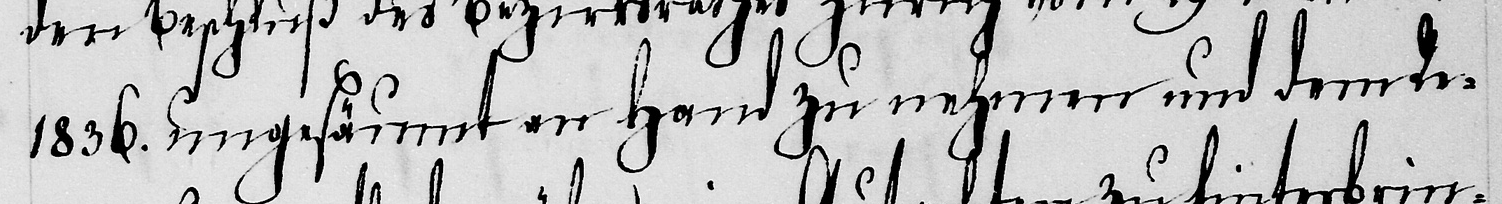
1836. ungesäumt an Hand zu nehmen und dem Re¬
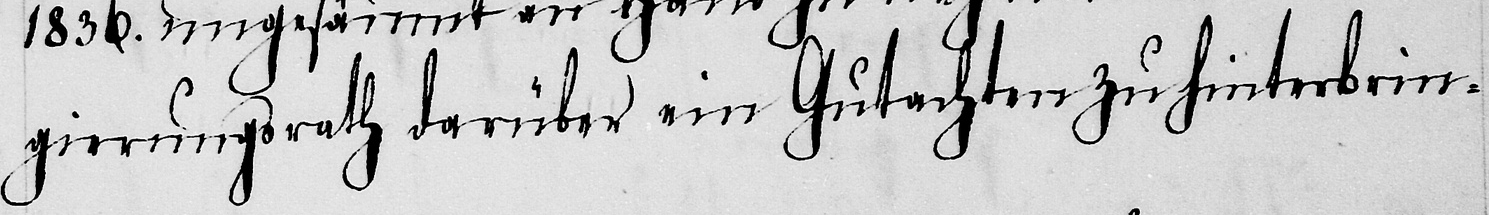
gierungsrath darüber ein Gutachten zu hinterbrin¬
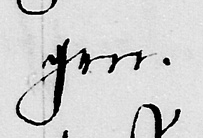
gen.
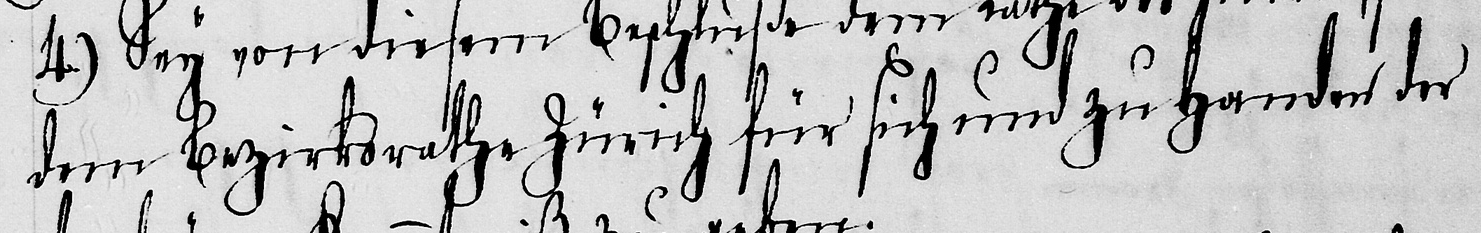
dem Bezirksrathe Zürich für sich und zu Handen der
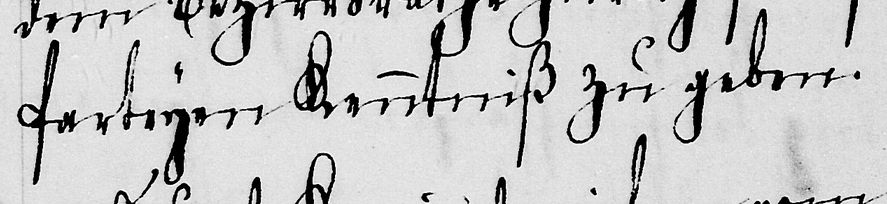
Parteyen Kenntniß zu geben.
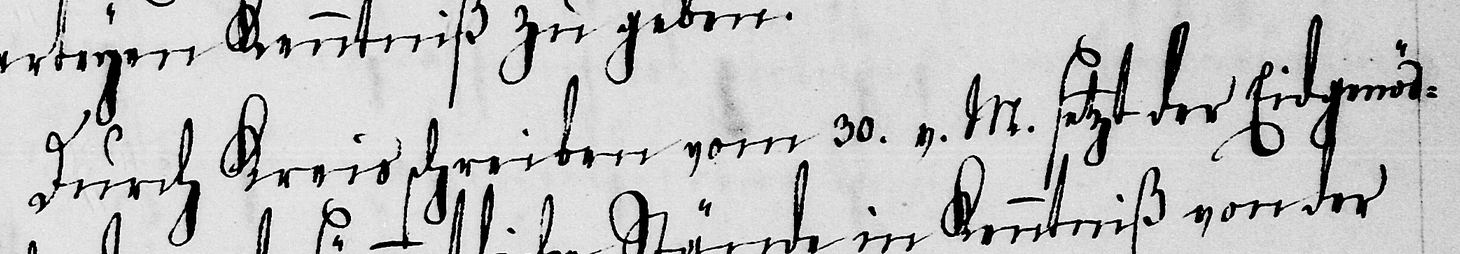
Durch Kreisschreiben vom 30. v. M. setzt der Eidgenöß¬
